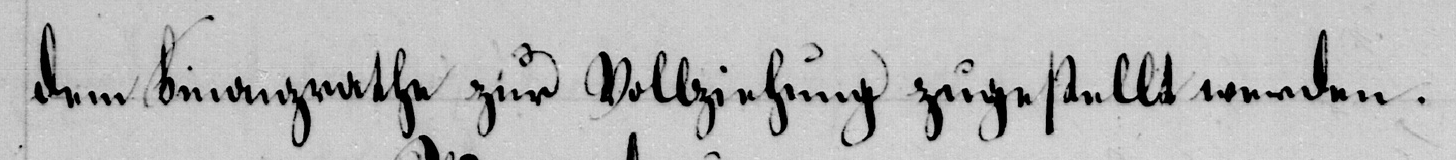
dem Finanzrathe zur Vollziehung zugestellt werden.
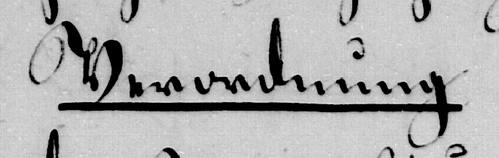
Verordnung
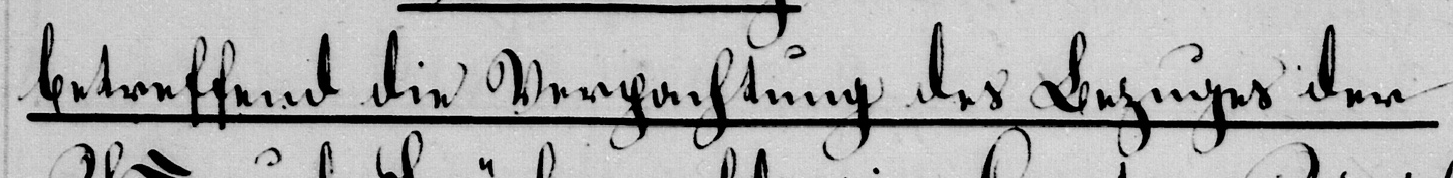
betreffend die Verpachtung des Bezuges der
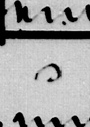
und
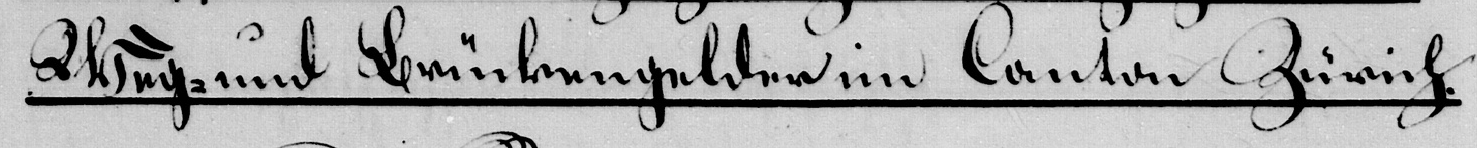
Weg- und Brückengelder im Canton Zürich.
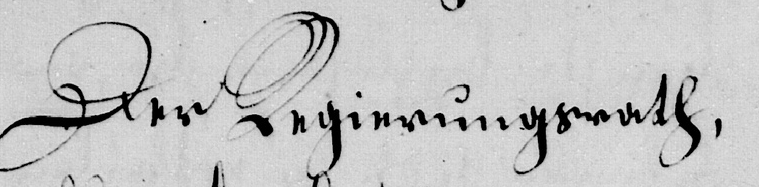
Der Regierungsrath,
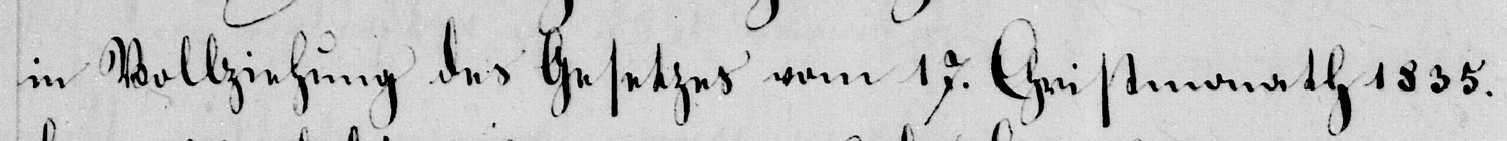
in Vollziehung des Gesetzes vom 17. Christmonath 1835.
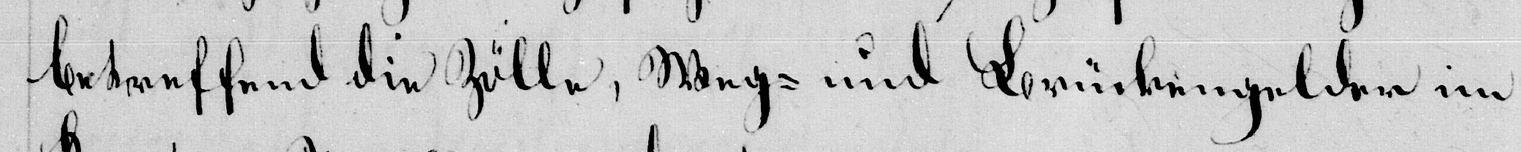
betreffend die Zölle, Weg- und Brückengelder im
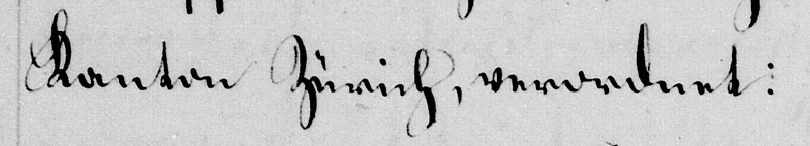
Kanton Zürich, verordnet:
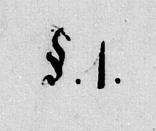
§. 1.
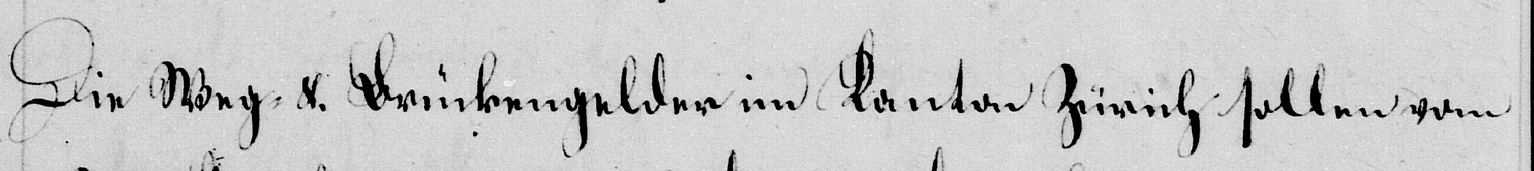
Die Weg &. Brückengelder im Kanton Zürich sollen vom
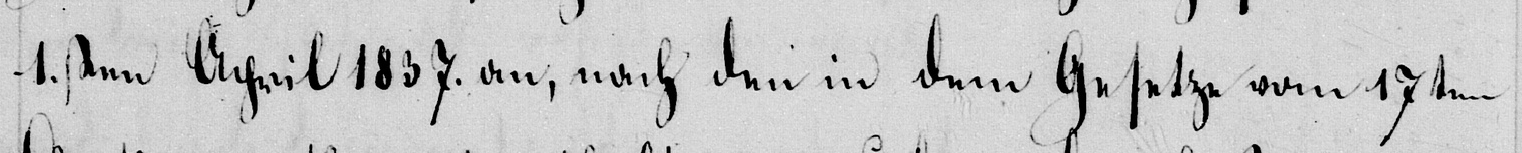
1.sten April 1837. an, nach den in dem Gesetze vom 17ten
